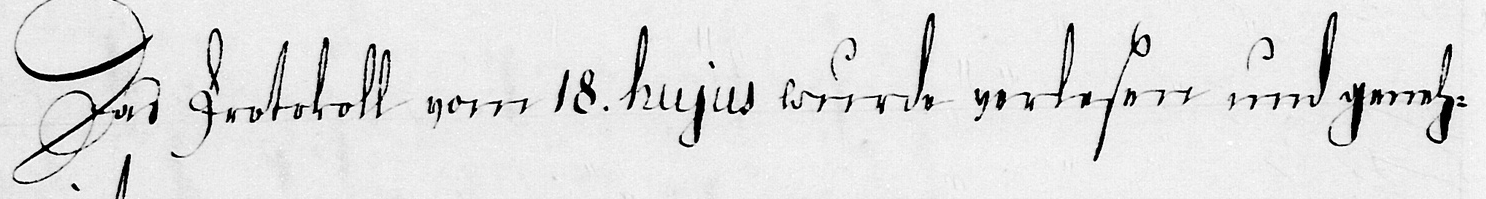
Das Protokoll vom 18. hujus wurde verlesen und geneh¬
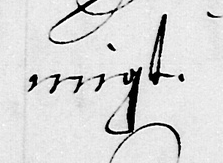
migt.
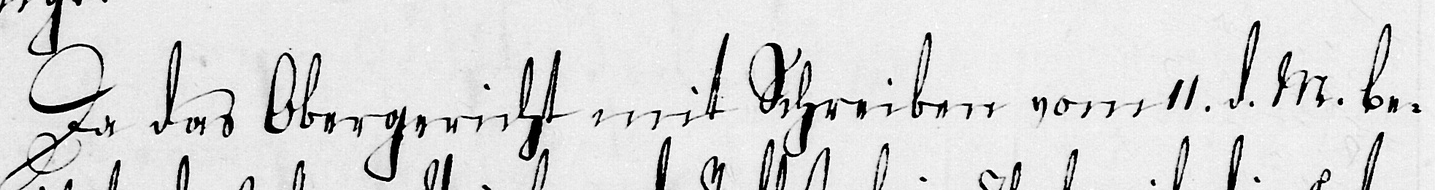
Da das Obergericht mit Schreiben vom 11. d. M. be¬
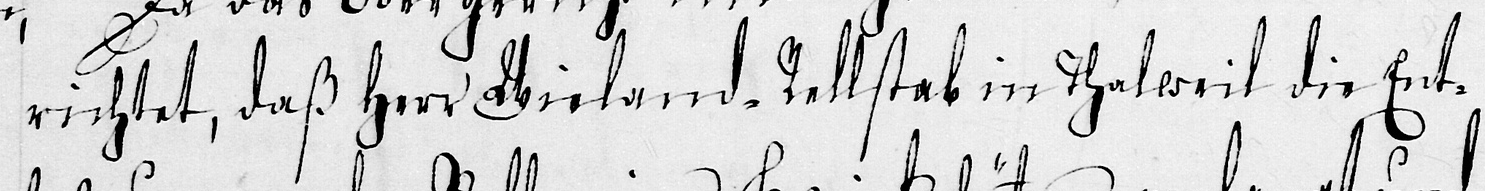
richtet, daß Herr Wieland-Rellstab in Thalweil die Ent¬
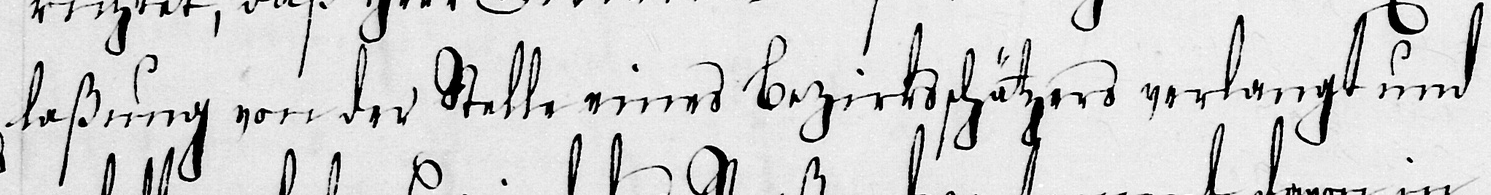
laßung von der Stelle eines Bezirksschätzers verlangt und
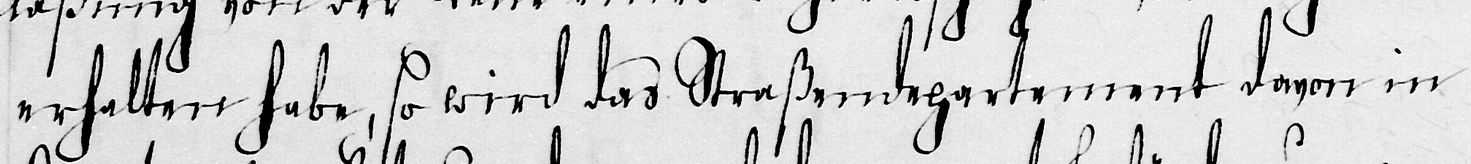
erhalten habe, so wird das Straßendepartement davon in
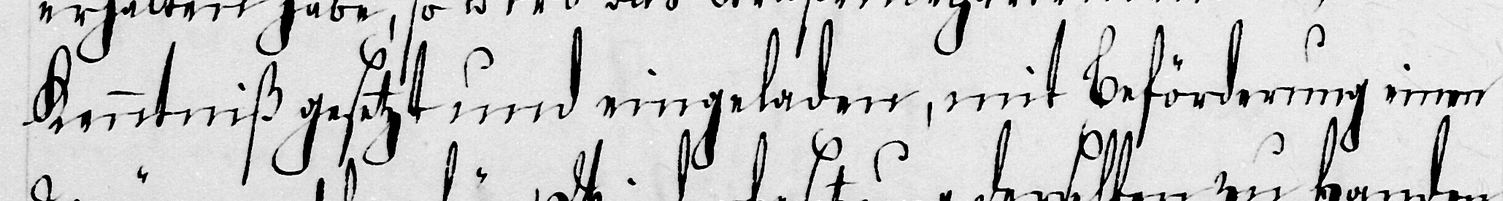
Kenntniß gesetzt und eingeladen, mit Beförderung einen
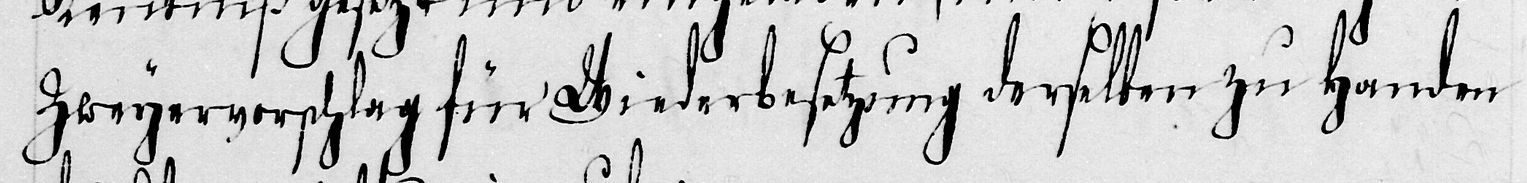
Zweyervorschlag für Wiederbesetzung derselben zu Handen
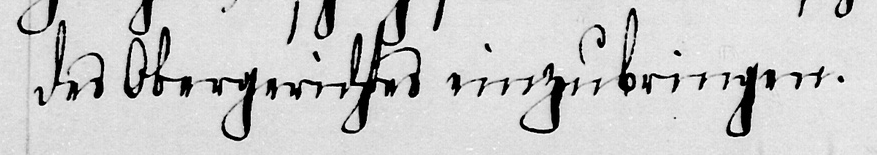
des Obergerichtes einzubringen.
